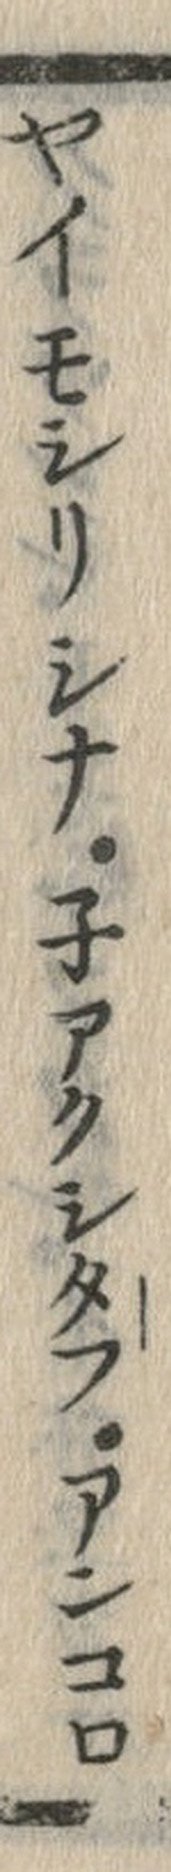ヤイモシリシナ。ネアクシタフ。アンコロ
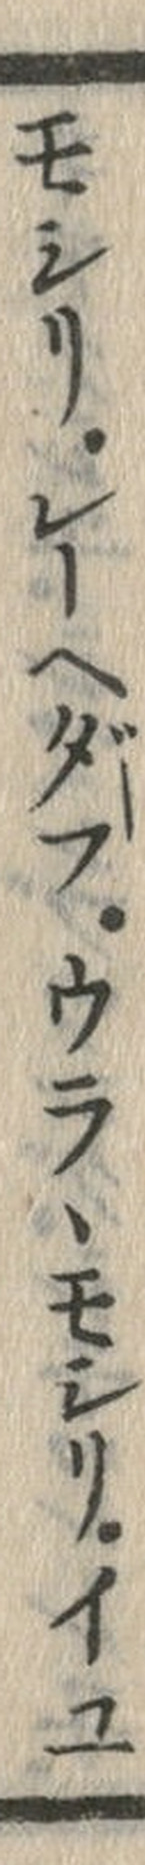モシリ。レーヘダフ。ウラヽモシリ。イユ
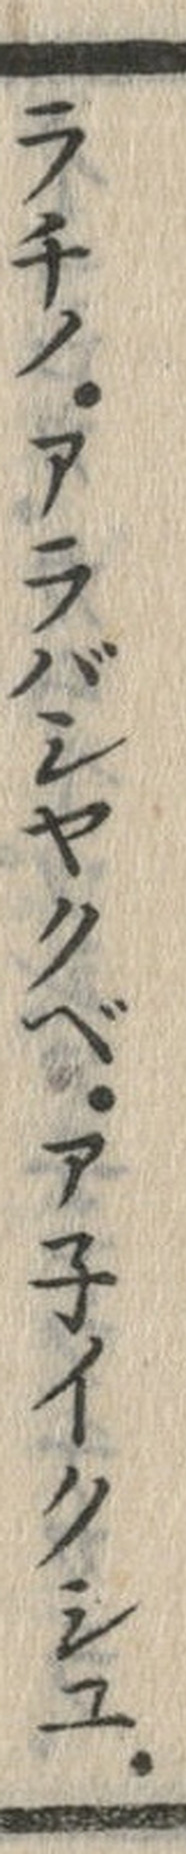ラチノ。アラバシヤクベ。アネイクシユ。
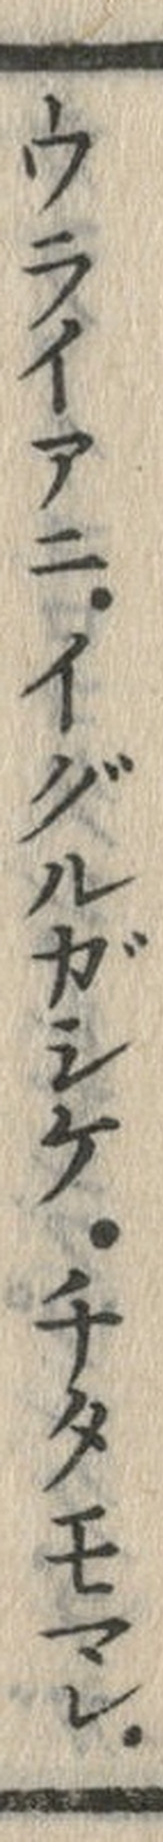ウライアニ。イグルガシケ。チタモマレ。
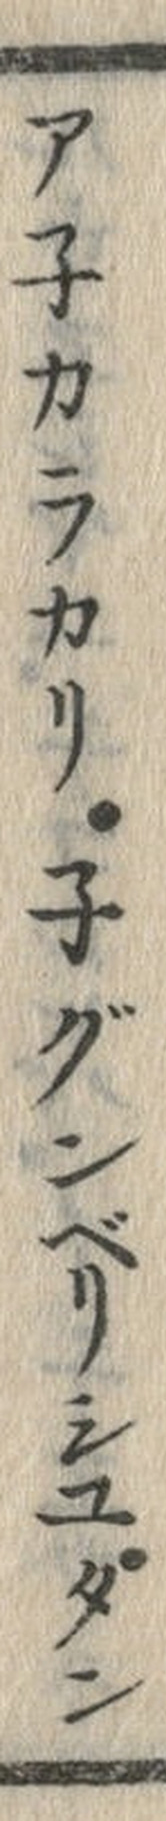アネカラカリ。ネグンベリシユ。タン

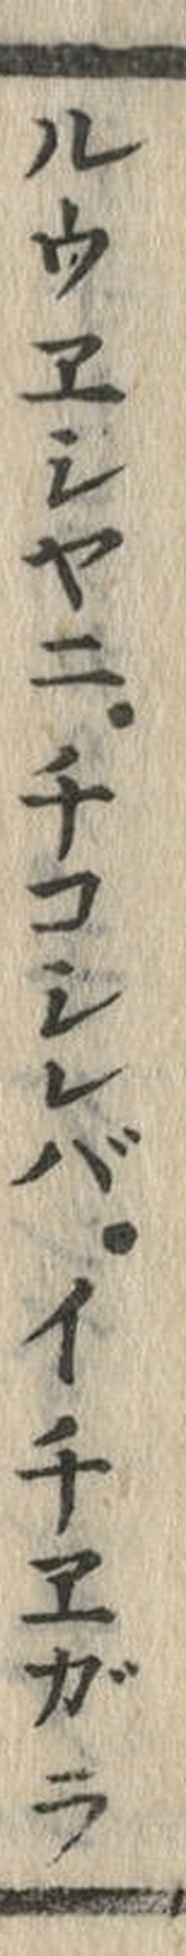ルウヱシヤニ。チコシレバ。イチヱガラ
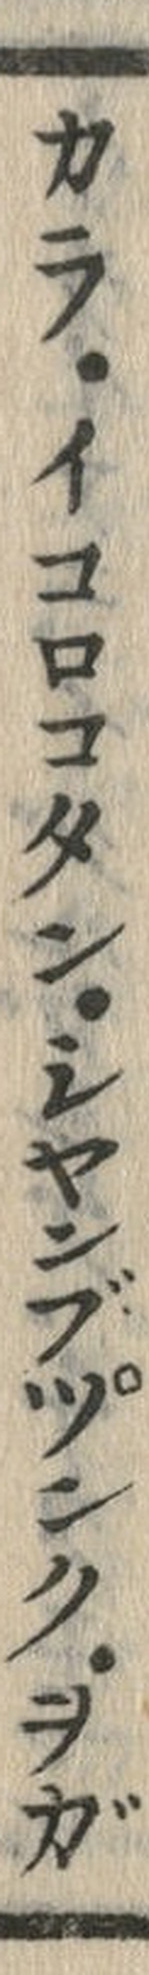カラ。イコロコタン。シヤンブツ゚ンク。ヲガ
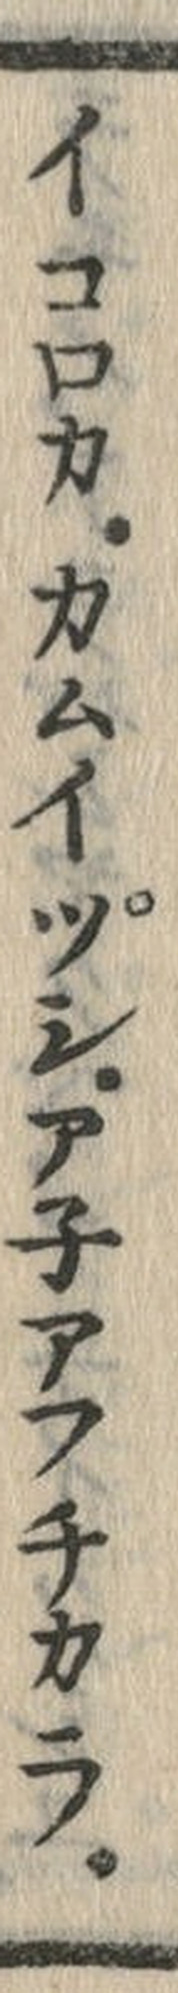イコロカ。カムイツ゚シ。アネアフチカラ。
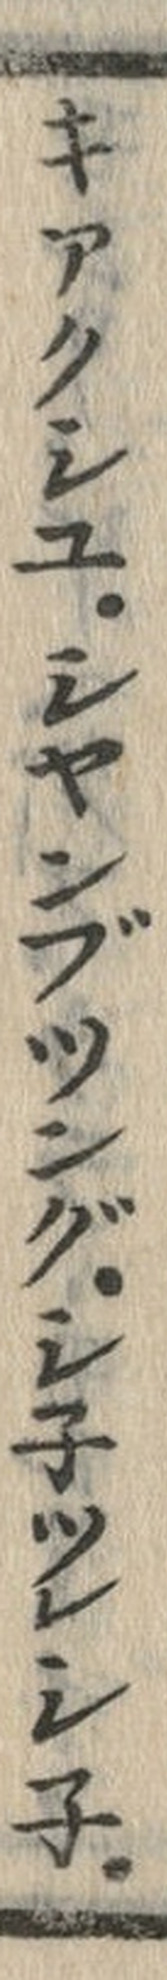キアクシユ。シヤンブツング。シネツレシネ。
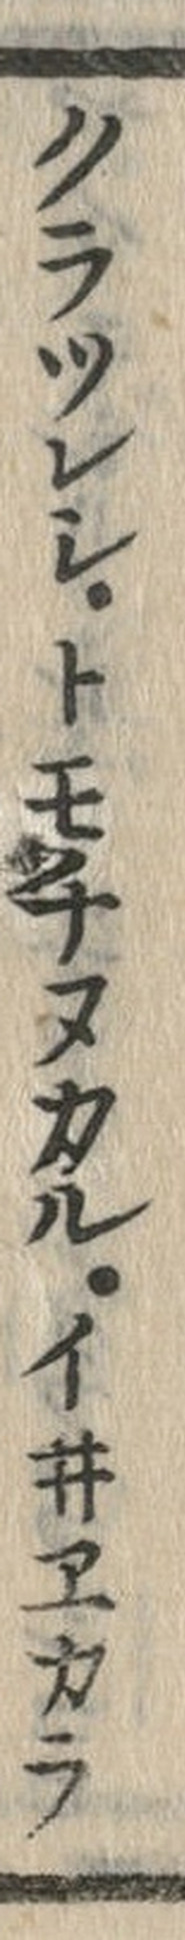クラツレシ。トモチヌカル。イヰヱカラ
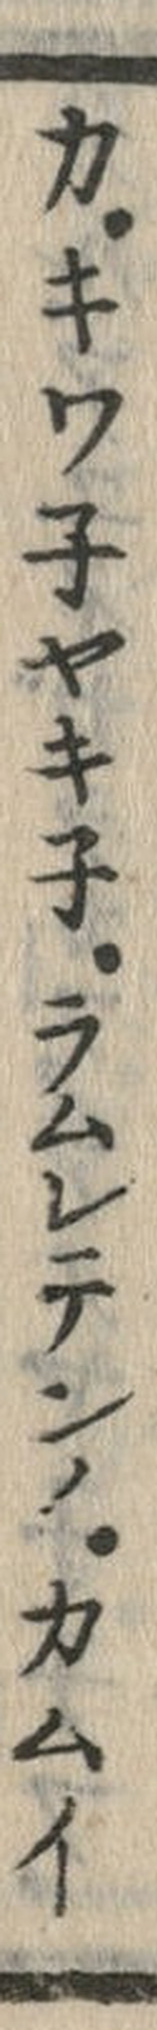カ。キワネヤキネ。ラムレテンノ。カムイ
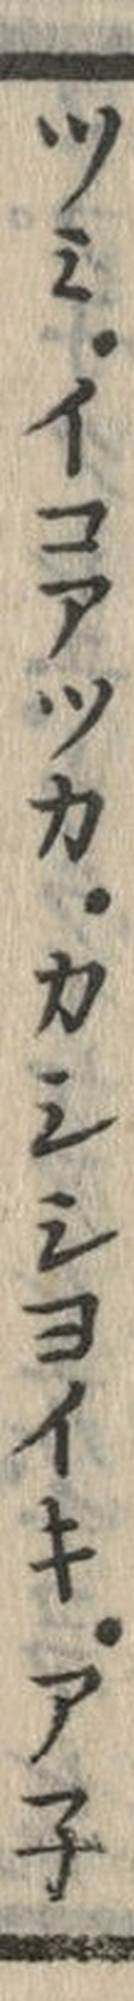ツ゚ミ。イコアツカ。カシシヨイキ。アネ
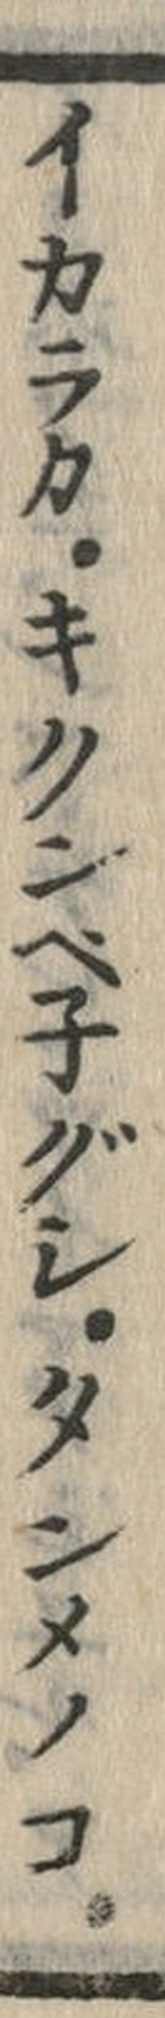イカラカ。キクンベネグシ。タンメノコ。

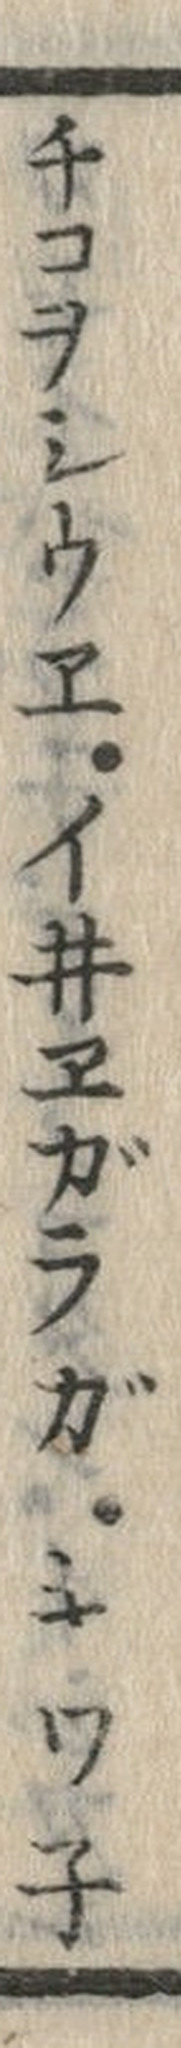チコヲシウヱ。イヰヱガラガ。キワネ
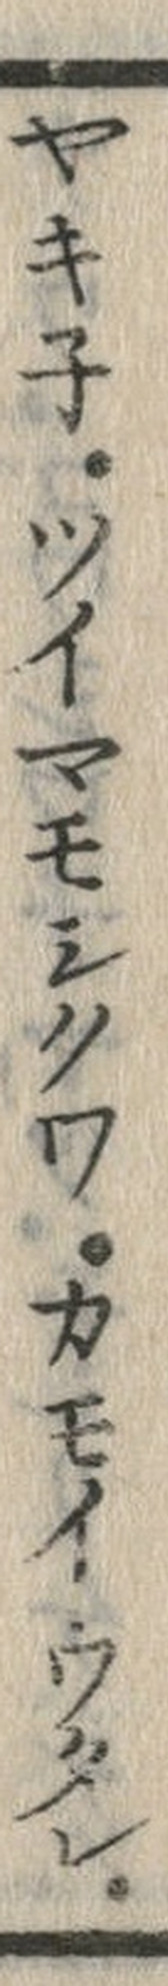ヤキネ。ツイマモシクワ。カモイウタレ。
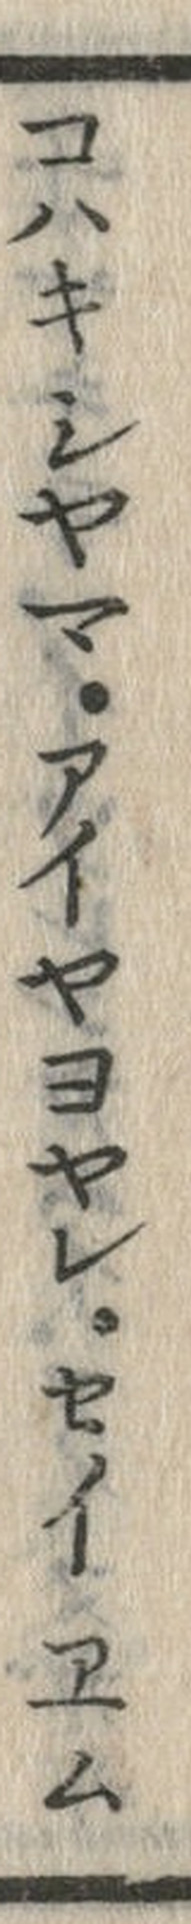コハキシヤマ。アイヤヨヤレ。セイヱム
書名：蝦夷方言藻汐草　坤巻
